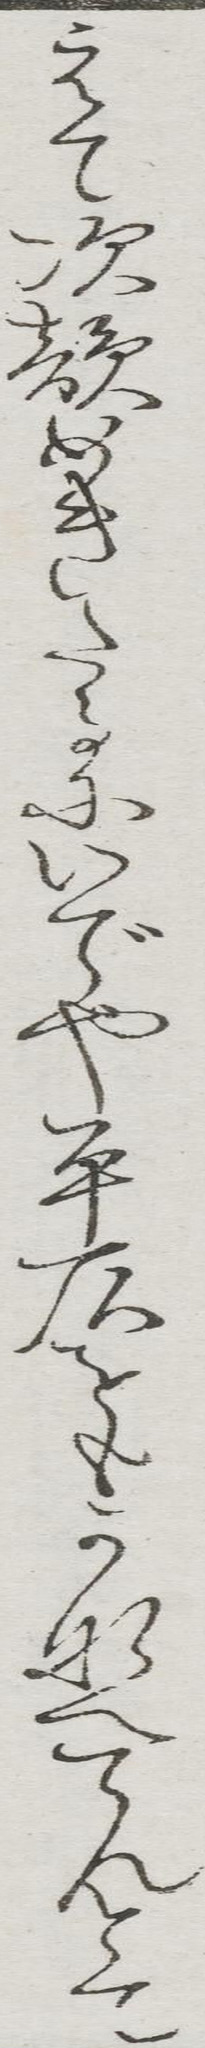えて次韻めきたるにいでや平仄をもかなへてんとて
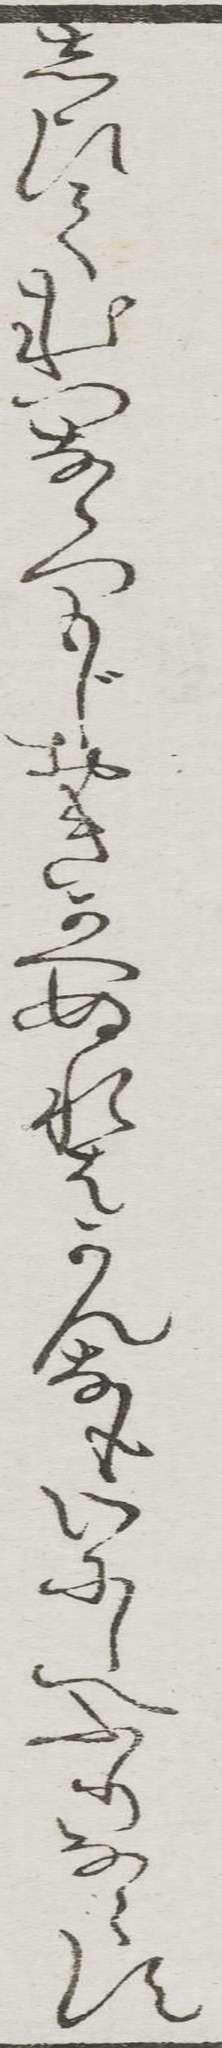しひてむつなゝつもじおきかへぬれはかんなもいにしへふりならす
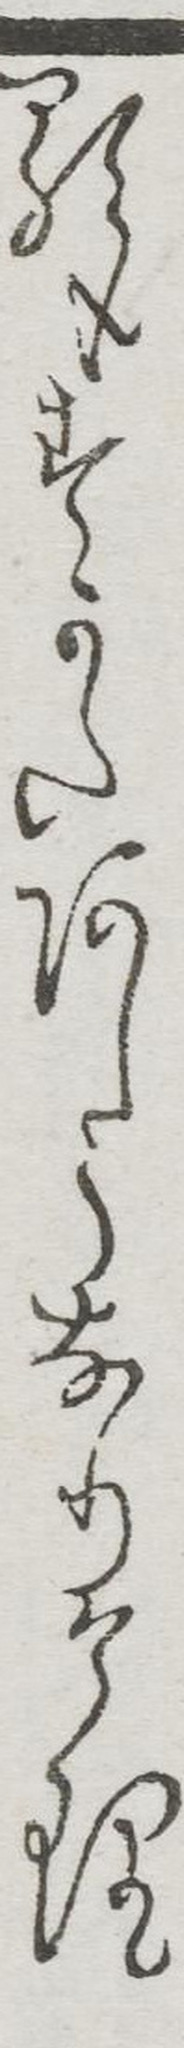歌もすかたあしうなりけり
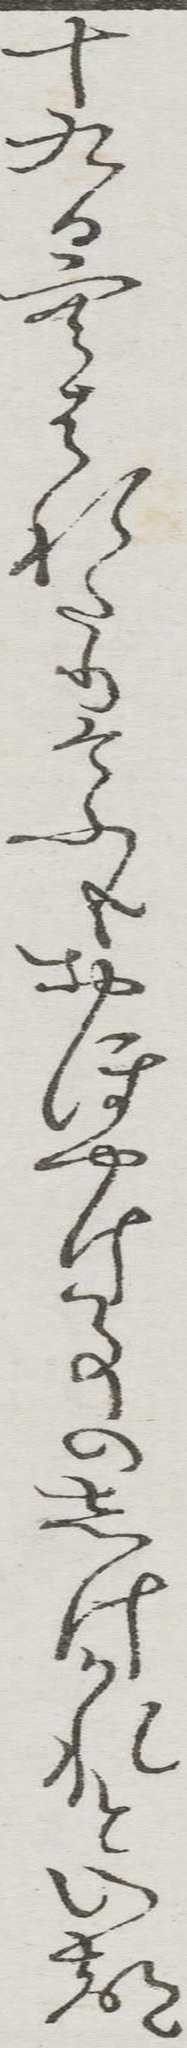十九日空はれはれたりけふもおほやけ事のしけかれといつ
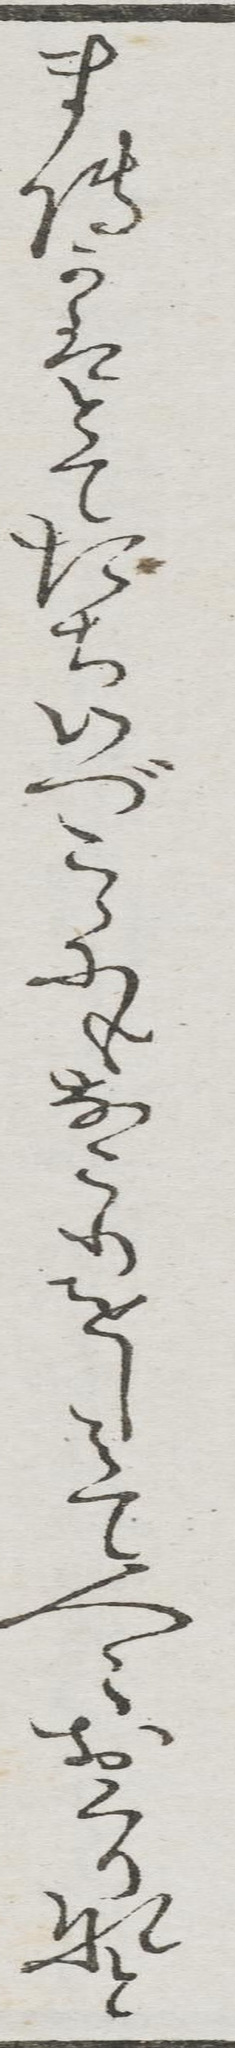またかはとてたちいづこゝにもなこりをしみて人々おくりなと
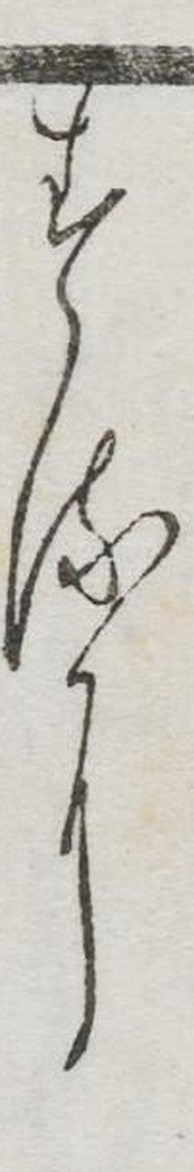するに
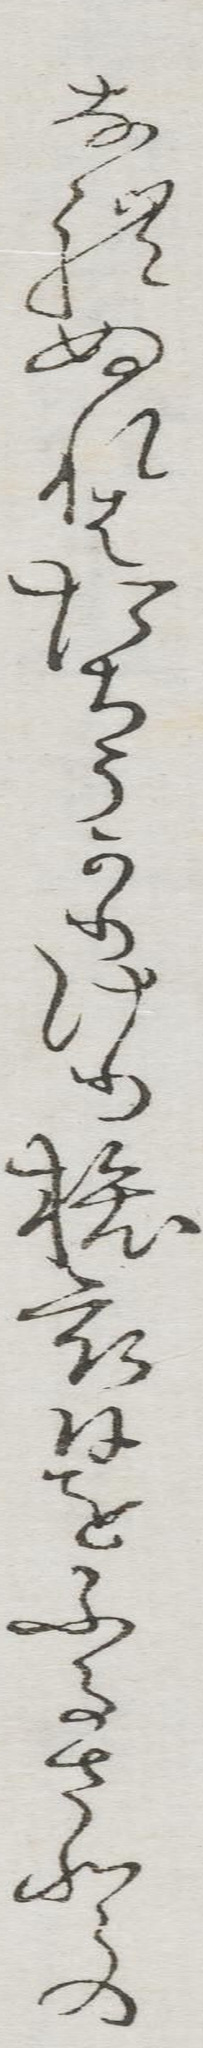なれぬれはたちうかりけり旅衣日をふるさとの
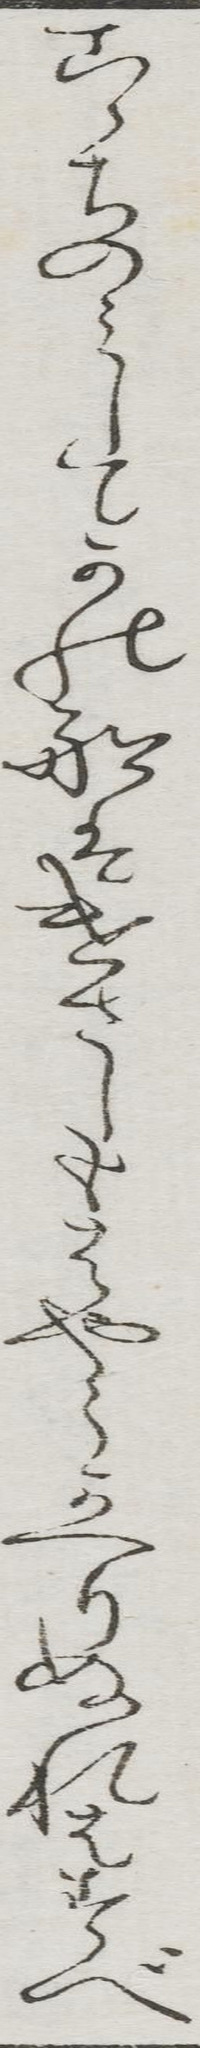こゝちのみしてかの船はけさしもはやうかへりぬれはすべ
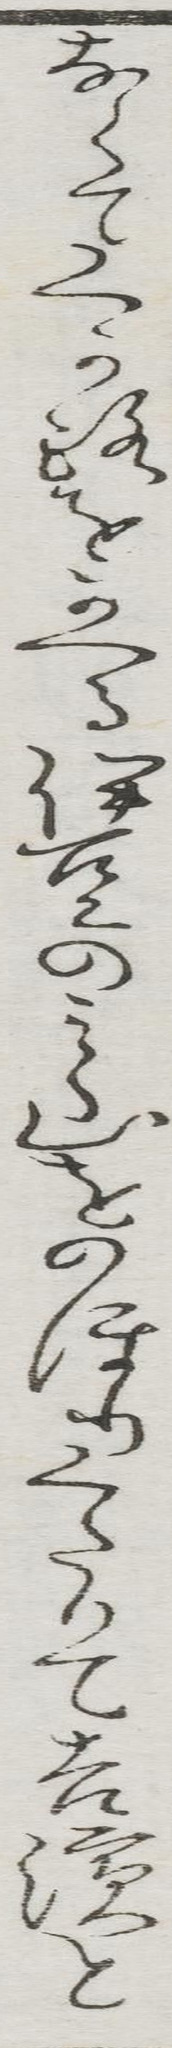なくてくか路をかへる伊豆のみやまをのほりくたりて吉浜と
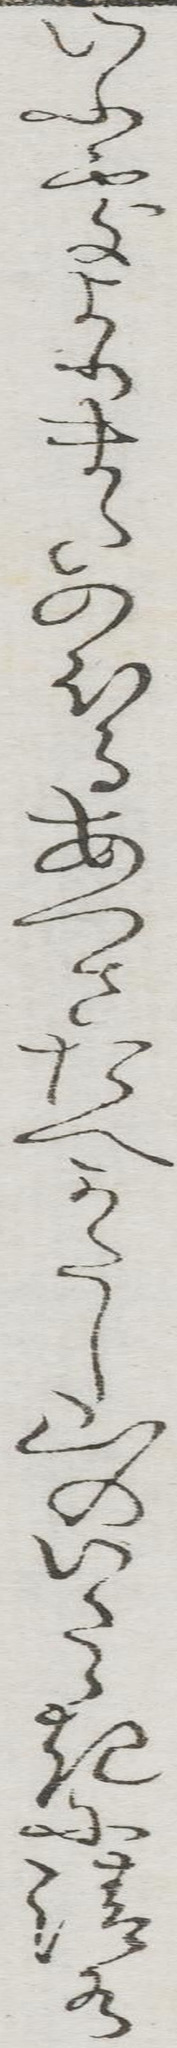いふ処よりまたのほるあつさたへかたし山のいたゝきに清水
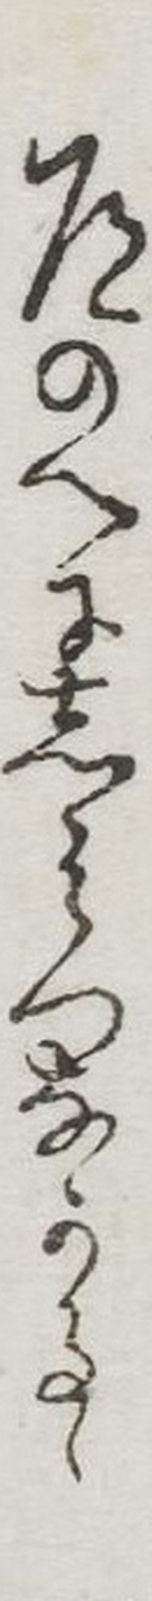道のへにしみつなかるゝ
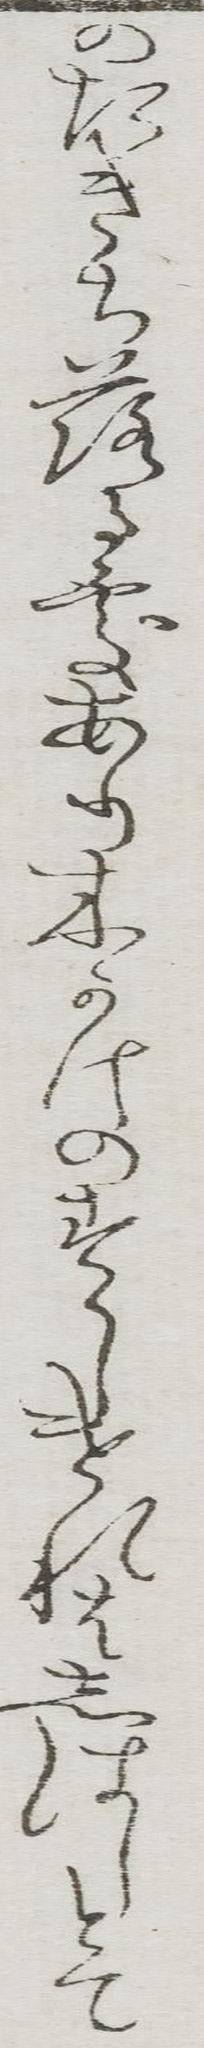のたきち落る処あり木かけのすゝしけれはしはしとて
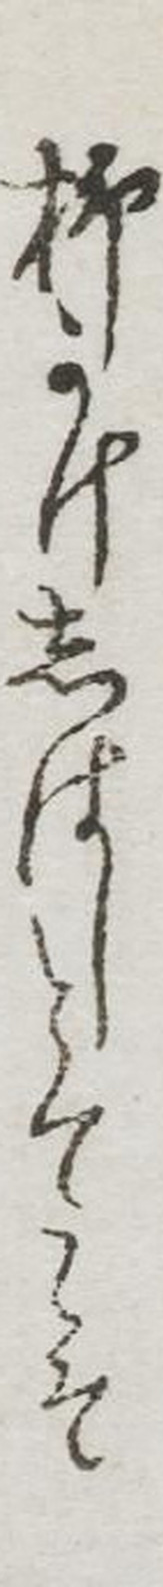柳かけしはしとてこそ
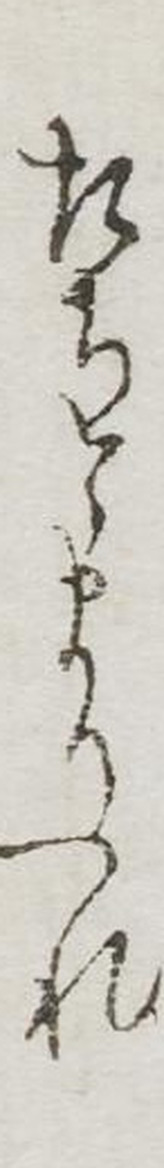たちとまりつれ
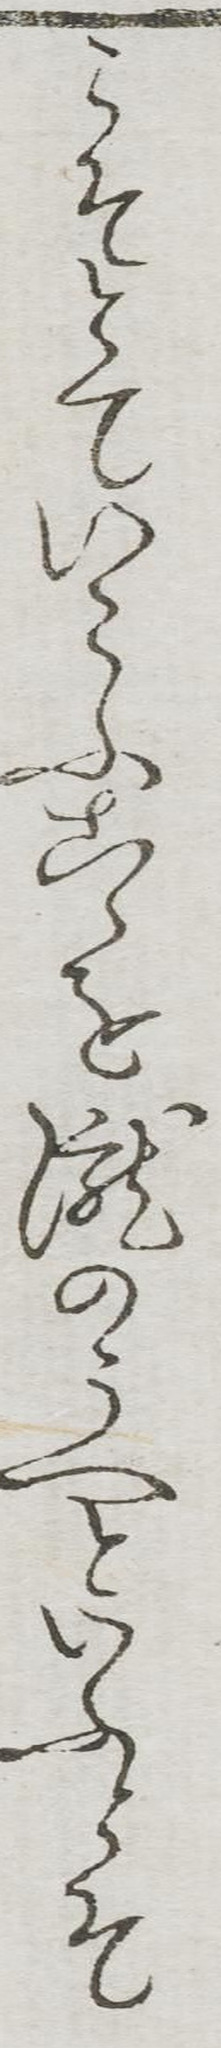こそとていこふこゝを瀧のうへといふこそ
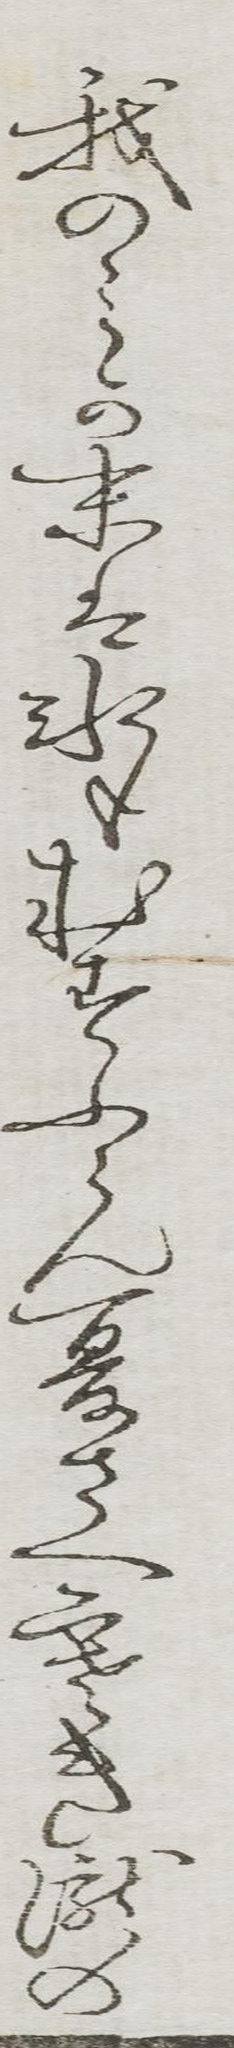我のみか末は氷もむすふらん夏さへ寒き瀧の
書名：挿画熱海日記　全
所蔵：東京大学地震研究所図書室 Earthquake Research Institute Library, The University of Tokyo, JAPAN
